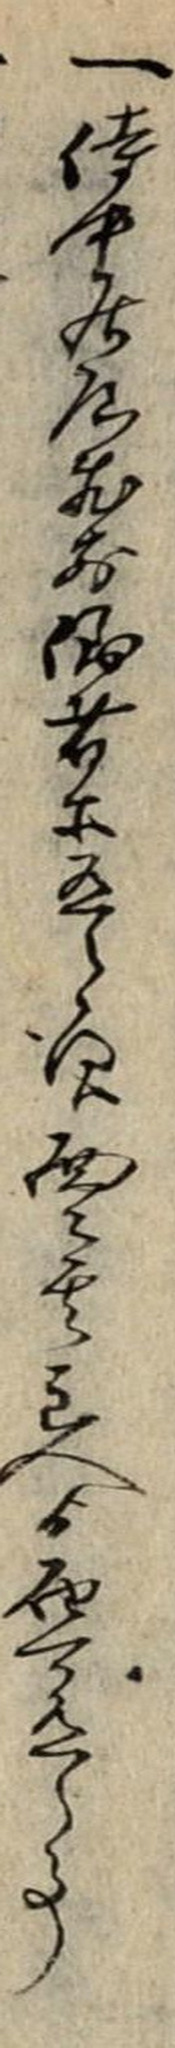一侍中居屋敷前倒者等有之候得は面々其主人ゟ届可有之事
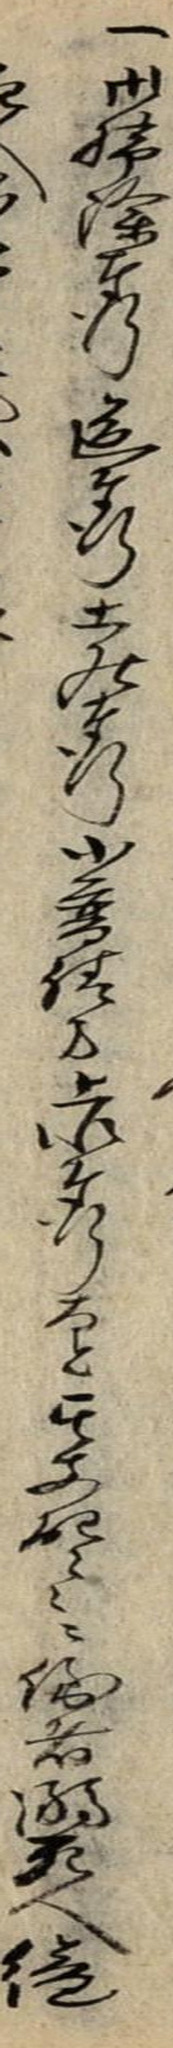一御掃除奉行道奉行土居奉行小普請方上水奉行なと其支配々々に倒者溺死人縊
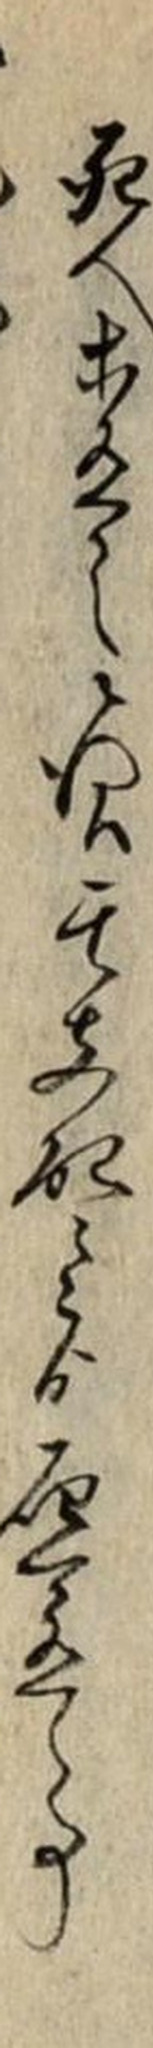死人等有之候得は其支配々々ゟ届可有之事
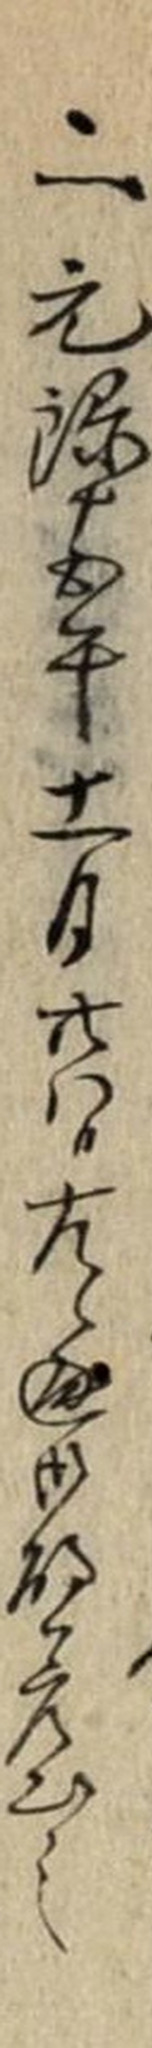一元禄十五午十一月廿八日左之通御触差出之
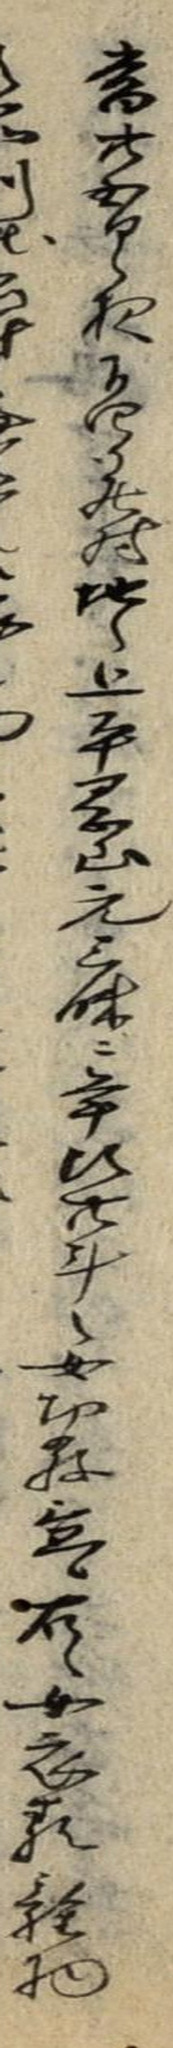当廿五日之夜下四ツ居村地之上平岡山元三味に年比廿斗之女切殺置候右之女衣類雑物
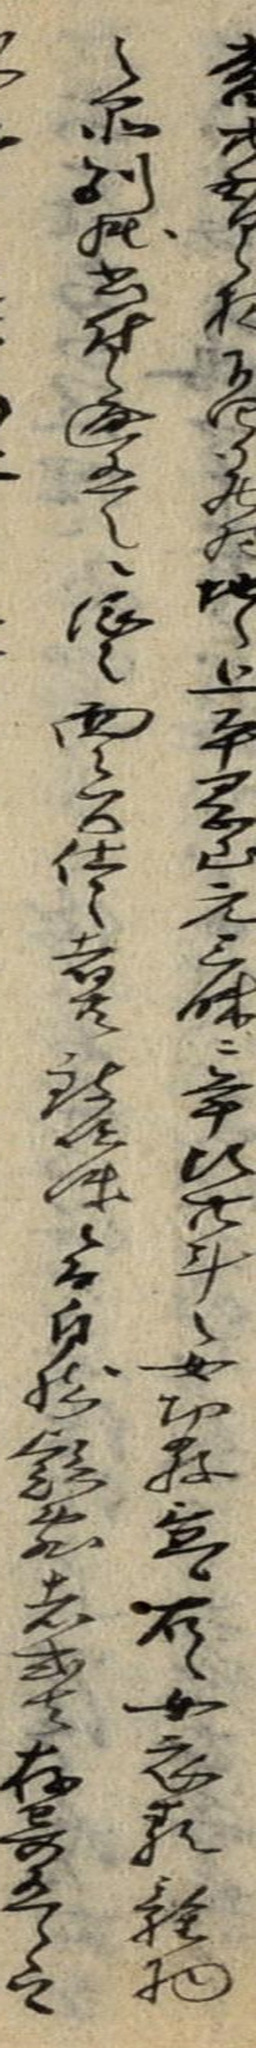之品別紙書付之通有之候依之面々召仕之者共致吟味候て自然疑敷者或は存寄有之候はゝ
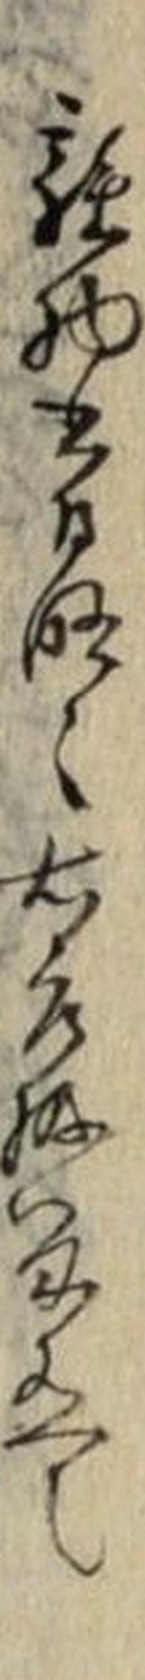雑物書付略之右取扱留有之
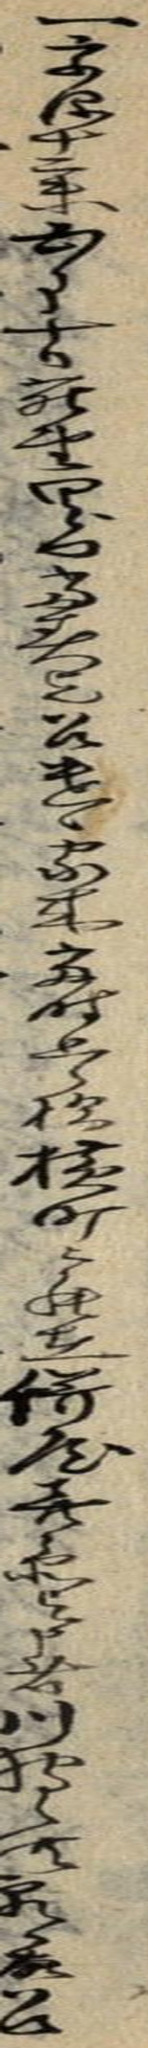一享保十二未五月十日荻野四郎右衛門当春迄召遣候家来当時上之橋横町に罷在餅屋喜兵衛と申者川狩之供願候故召
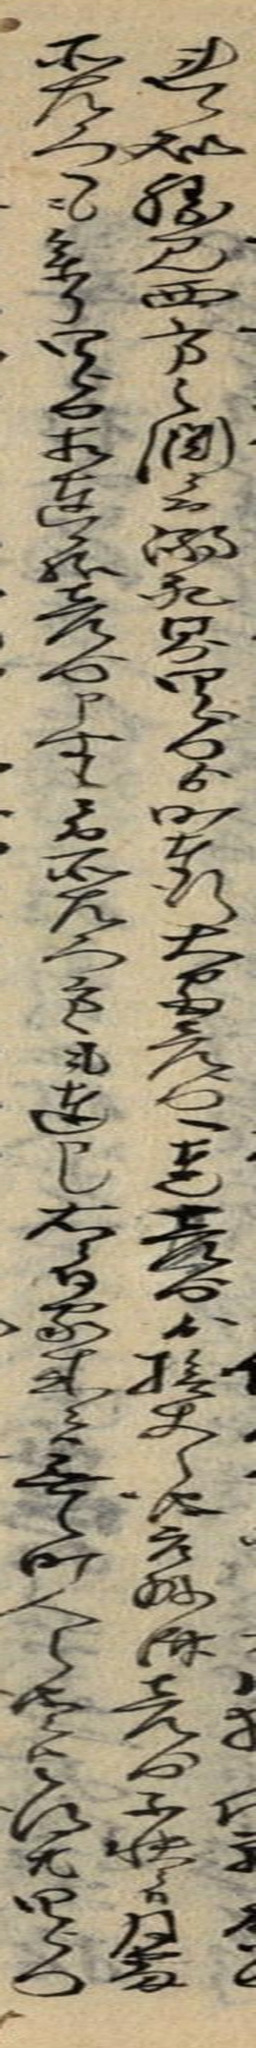所左衛門へも参り四郎右衛門相達候様彦右衛門申聞候に付所左衛門方へも達申候右に付家来には無之町人之儀には候得共四郎右衛門
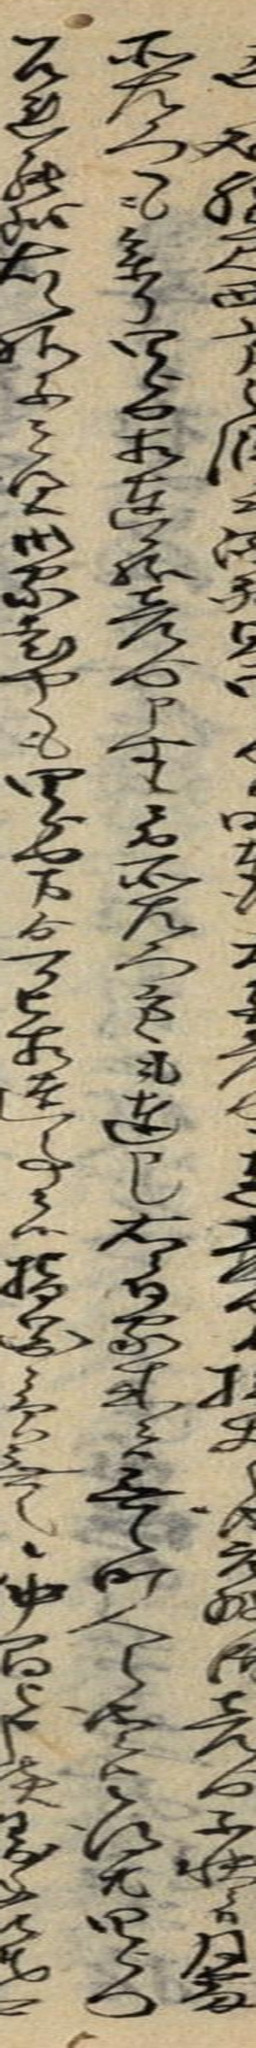召連罷越右之様子に候得は御家老中へも四郎右衛門方ゟ可被相達事に候指図にては無之候仲間被申談勝手次第可
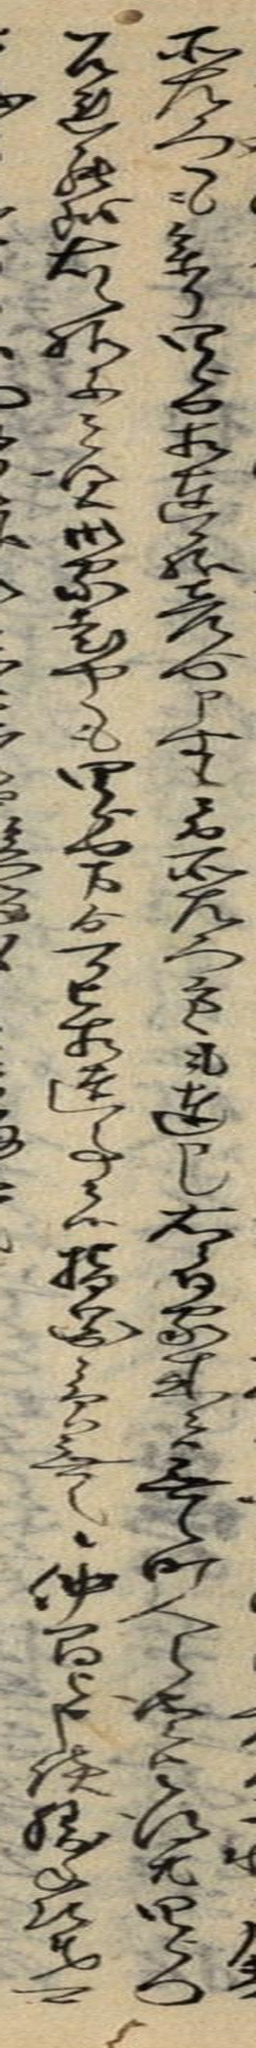召連罷越右之様子に候得は御家老中へも四郎右衛門方ゟ可被相達事に候指図にては無之候仲間被申談勝手次第可
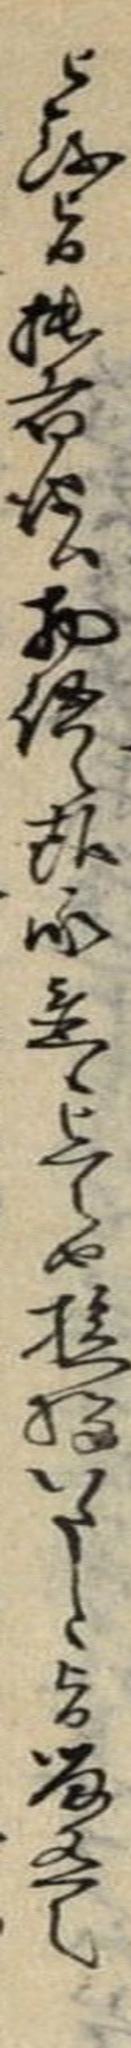被致旨拙者儀は物語之趣承置候迄之由挨拶いたし候旨留有之
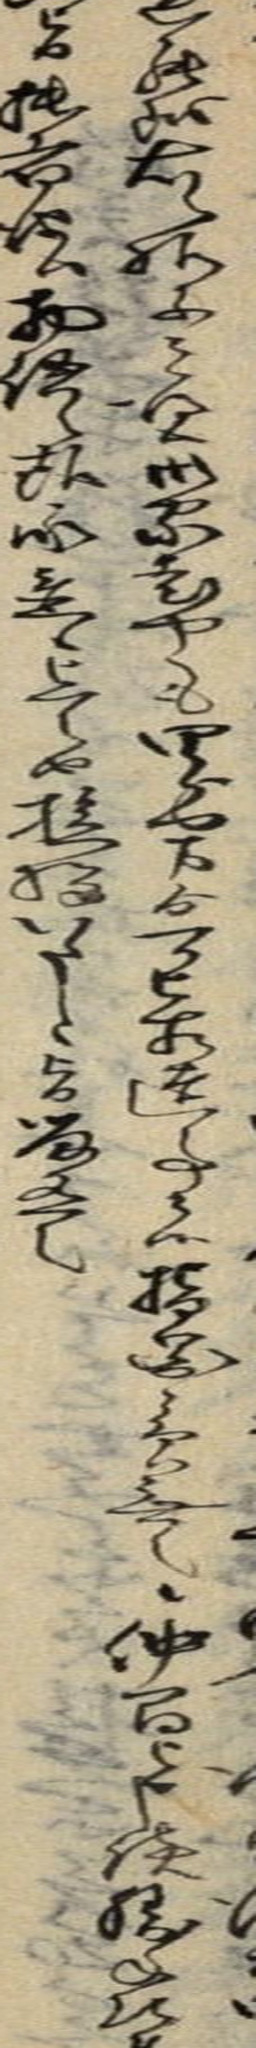被致旨拙者儀は物語之趣承置候迄之由挨拶いたし候旨留有之
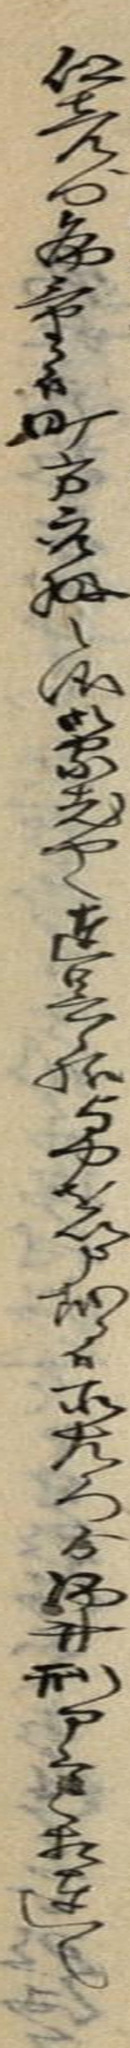但彦右衛門病気に付町方取扱之儀御家老中へ達呉候様与力を以申越候に付所左衛門ゟ酒井刑部方へ相達之
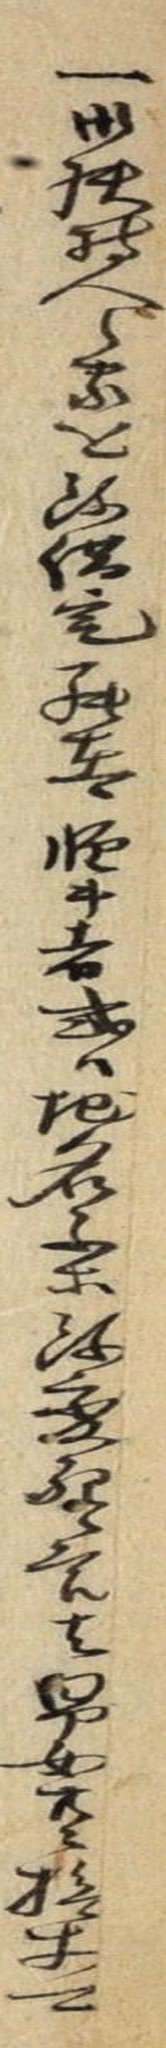一御扶持人之家を致借宅罷在候軽キ者或は地名子等致変死候節は男女共に検使可
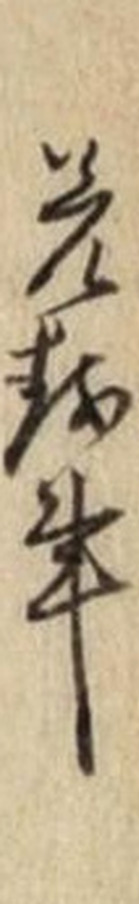差越事
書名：御停止異変死失
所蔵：福井県文書館 Fukui Prefectural Archives
